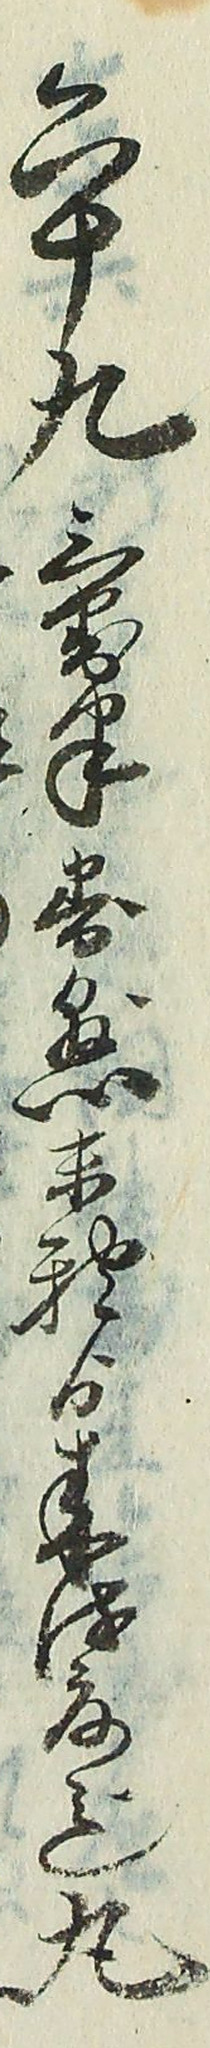六十九三歩半歩懸未秋ゟ来戌夏迄丸
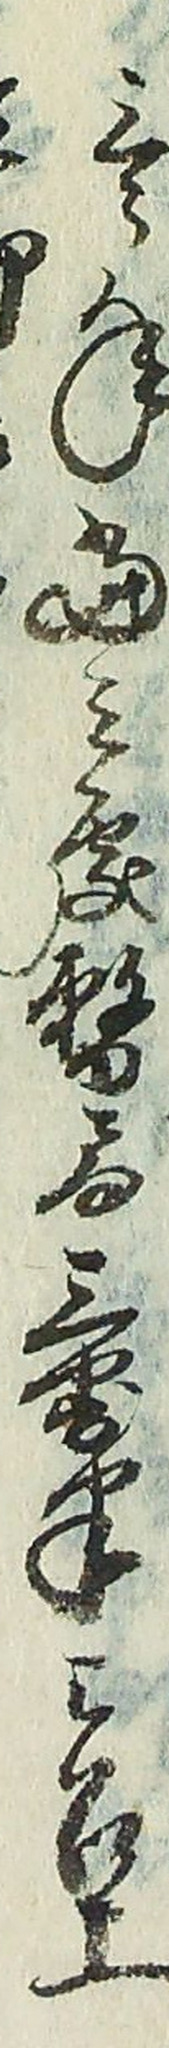三ヶ年當之處務ニ而三歩半被召上
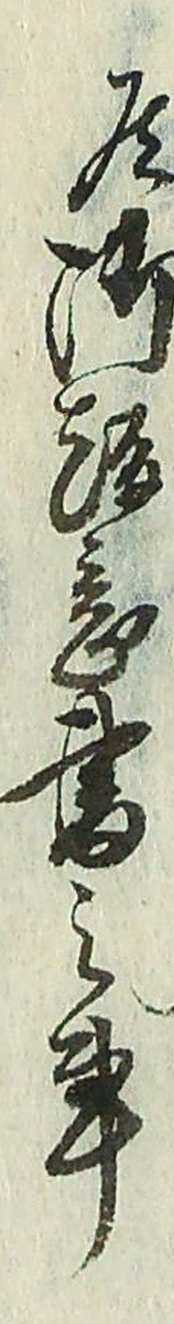候御趣意書之事
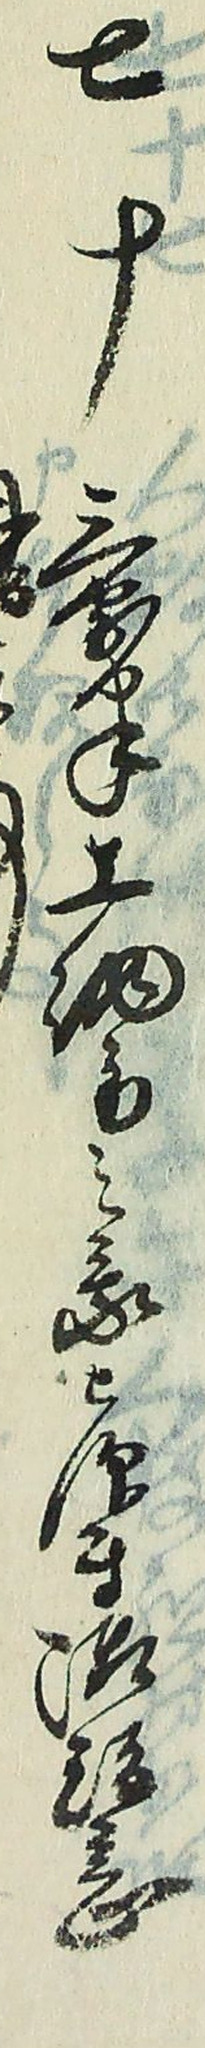七十三歩半上納方之義被仰付御趣意
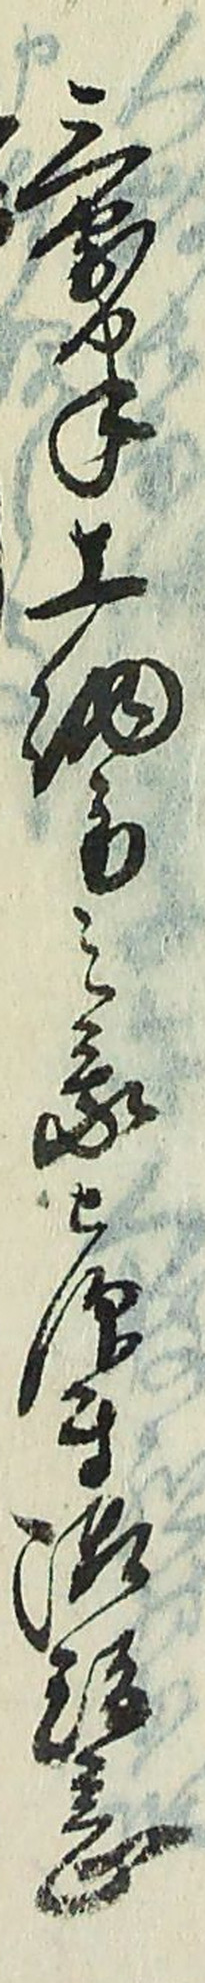七十三歩半上納方之義被仰付御趣意
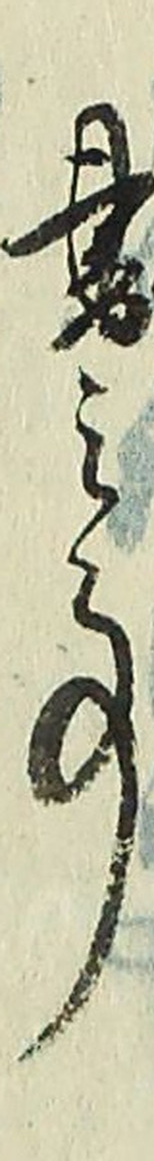書之事
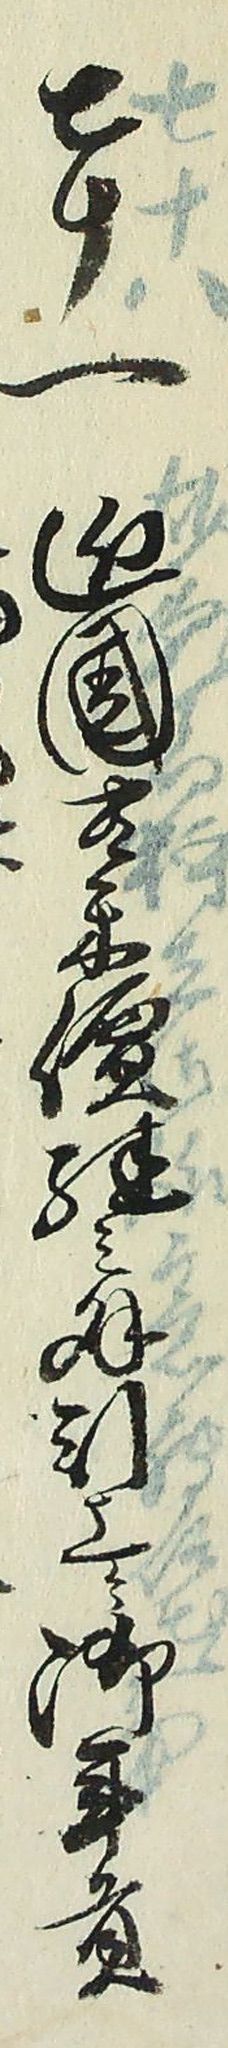七十一近國共米價殊之外引上ヶ御年貢
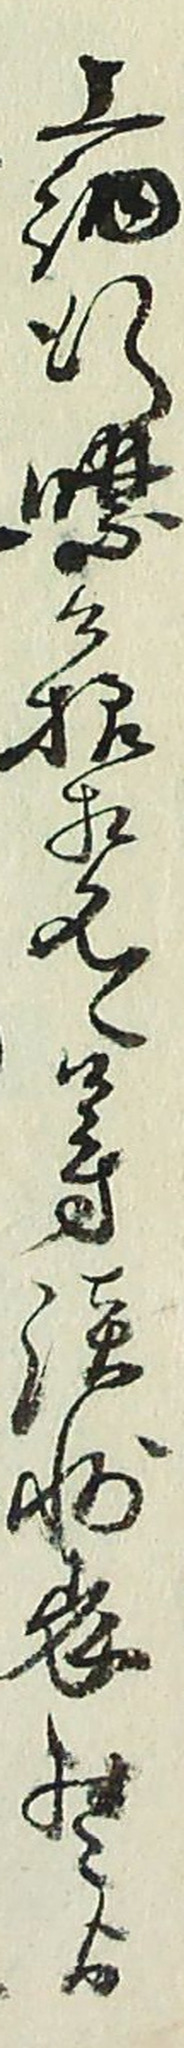上納行噤候様相見へ候ニ付淡州表村々ゟ
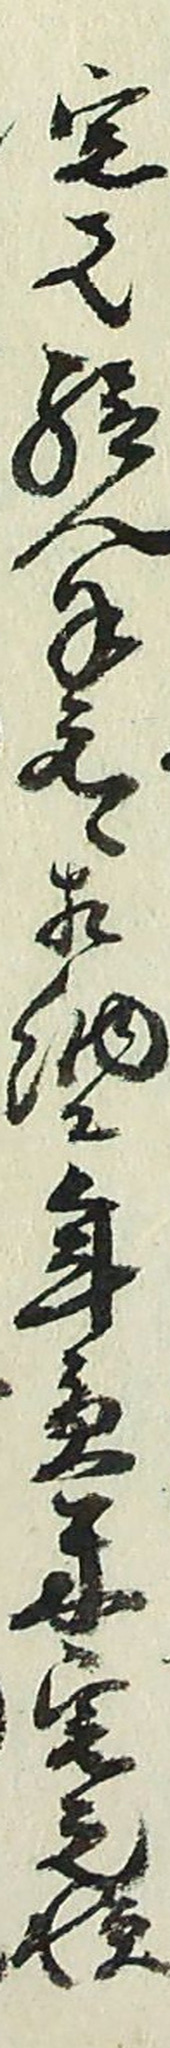爰元給人手元へ相納候年貢米爰元積
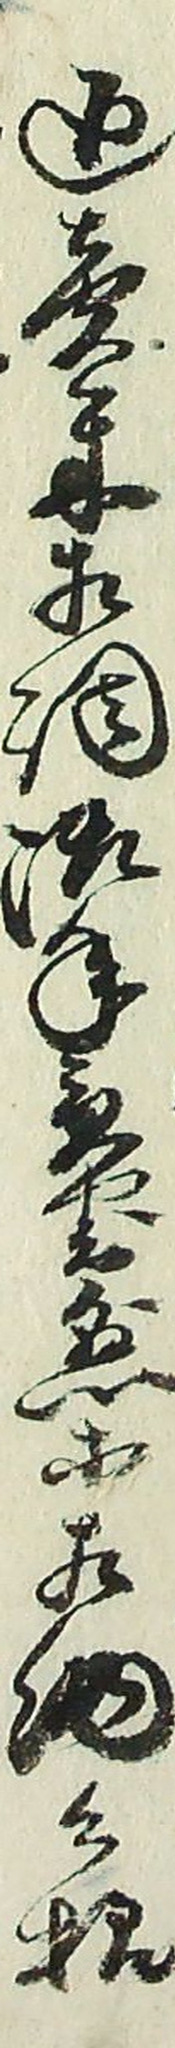返賣米相調御年貢歩懸等相納候様
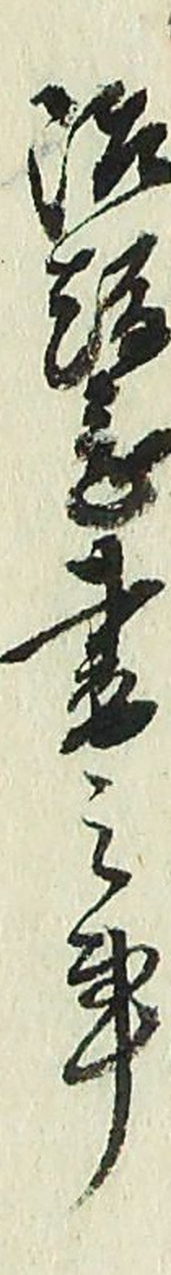御趣意書之事
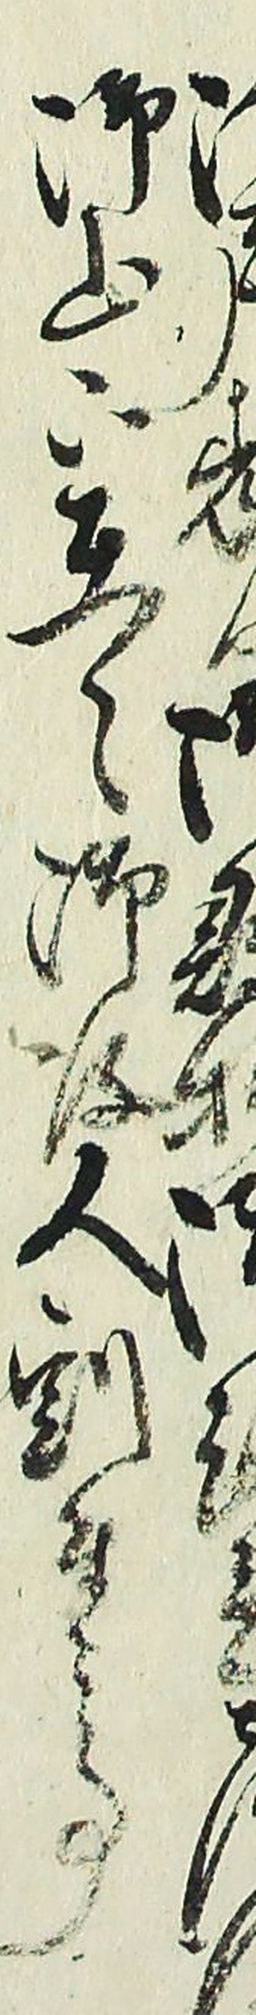御山下在之御役人割付之事
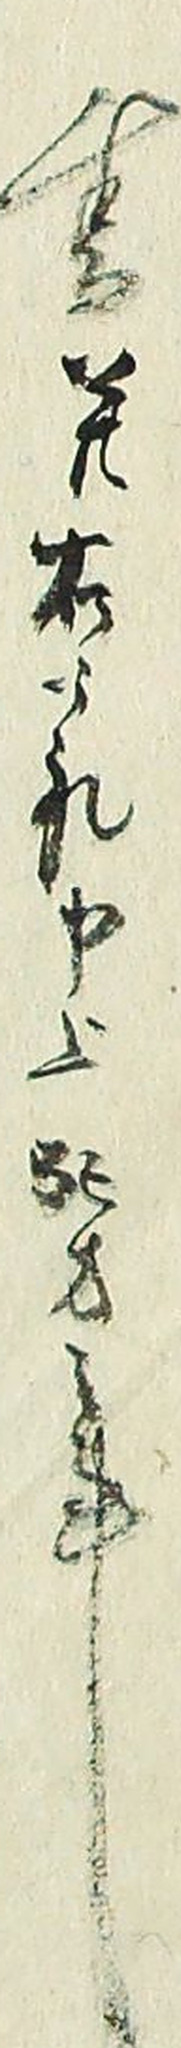書幷右御礼申上配方之事

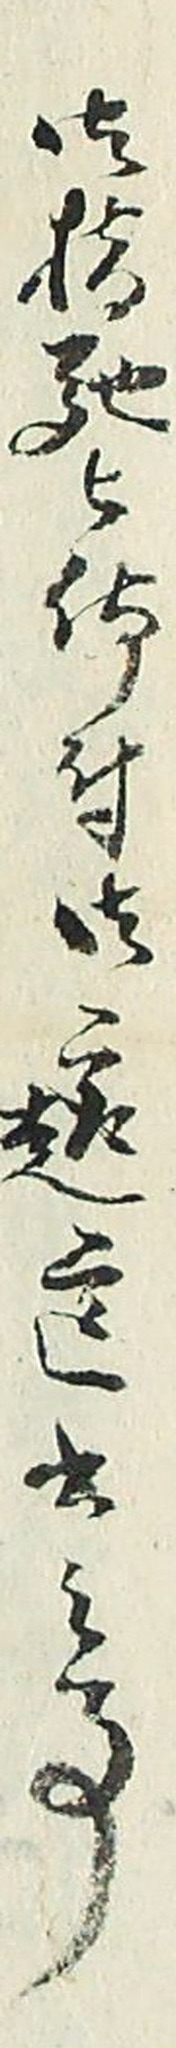御指弛被仰付御趣意書之事
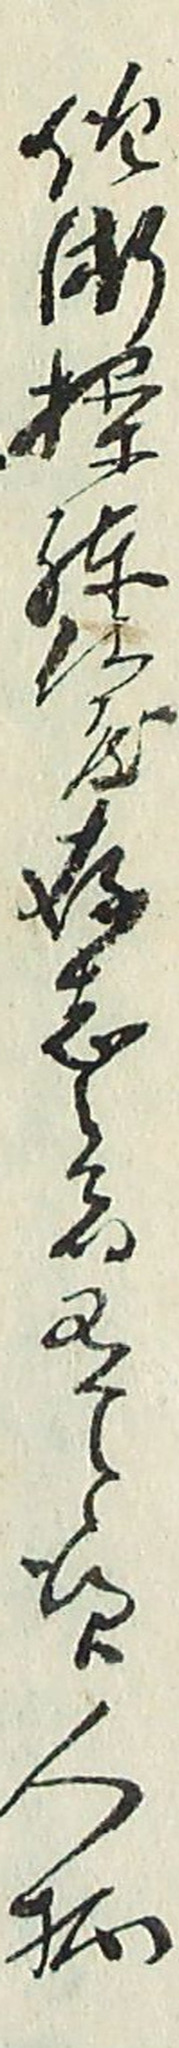砲術操練仕度存志之者有之候得ハ人柄
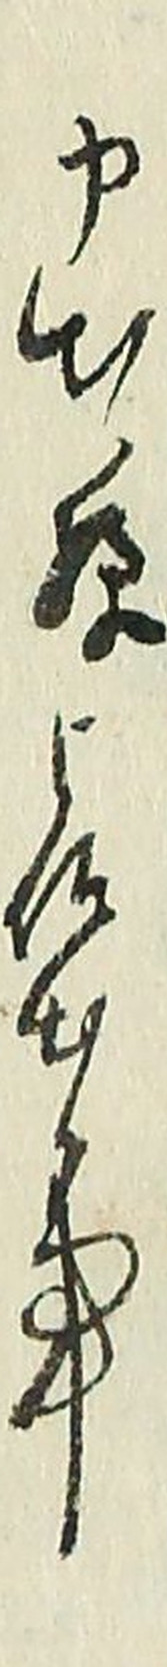申出候様被仰出候事
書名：諸御趣意書并御下知向之写
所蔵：鳴門教育大学 Naruto University of Education
